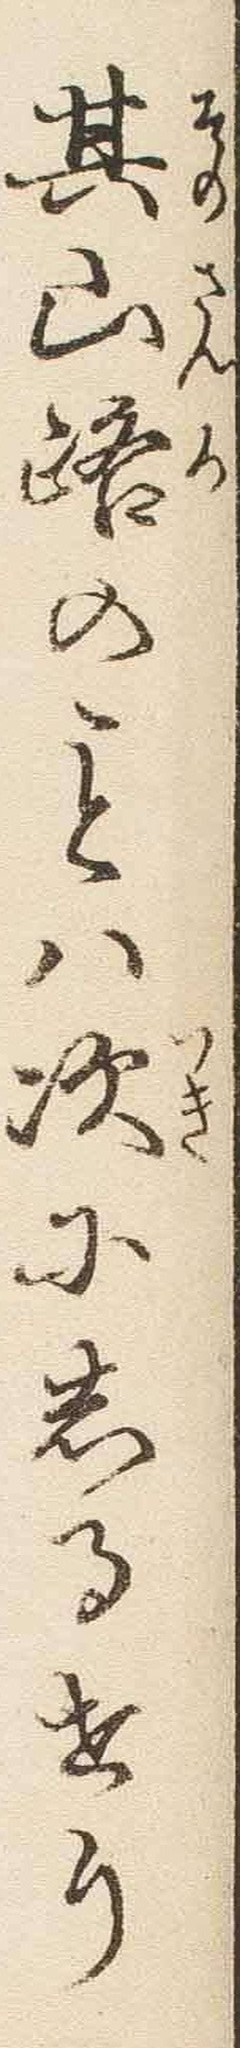其山路のことは次にしるせり
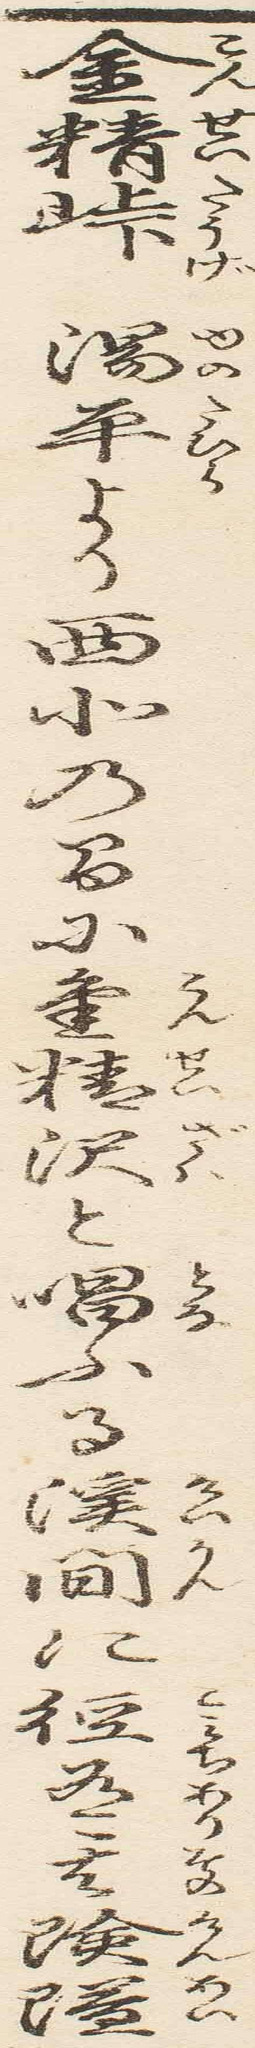金精峠湯平より西北の間に金精沢と唱ふる渓間に徑有其険隘
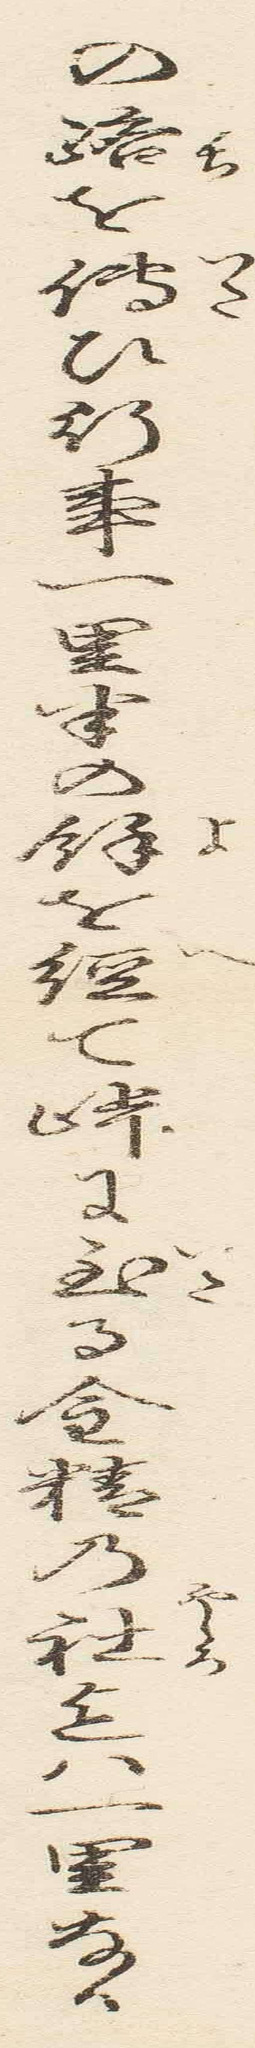の路を傳ひ行事一里半の餘を經て峠に至る金精の社迄は一里なり
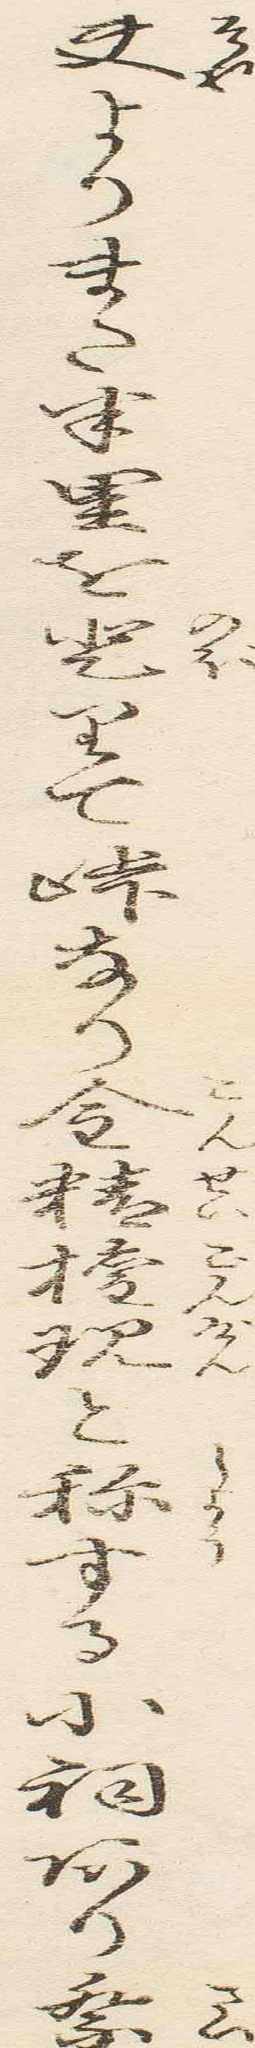夫よりまた半里を登りて峠なり金精權現と称する小祠あり祭
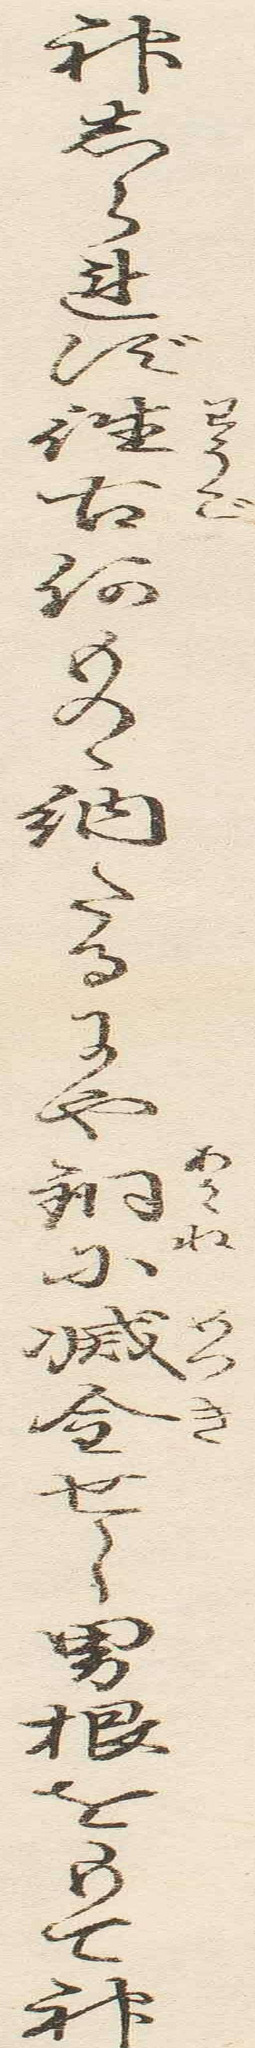神しられず徃古何ものゝ納たるにや銅に滅金せし男根をもて神
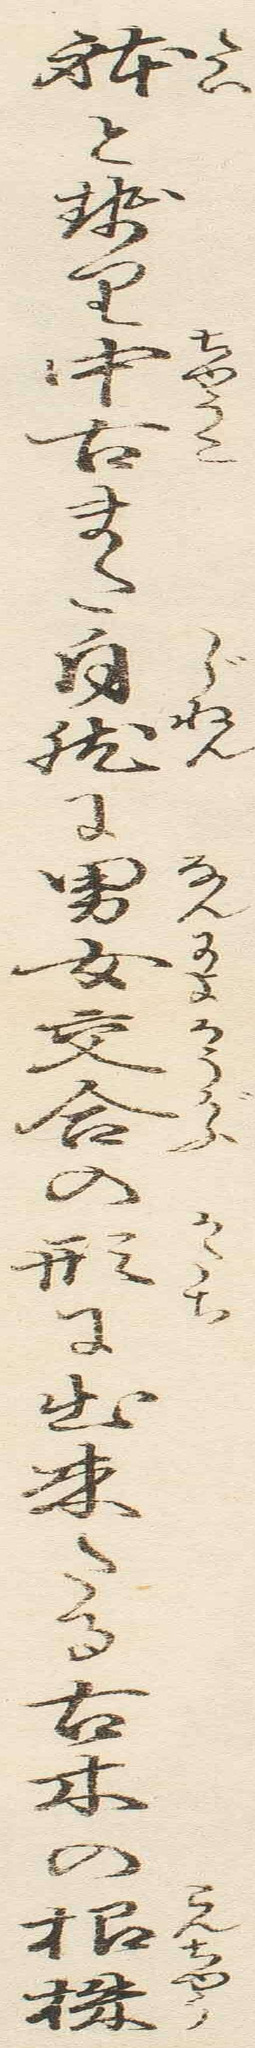躰とせり中古また自然に男女交合の形に出來たる古木の根株
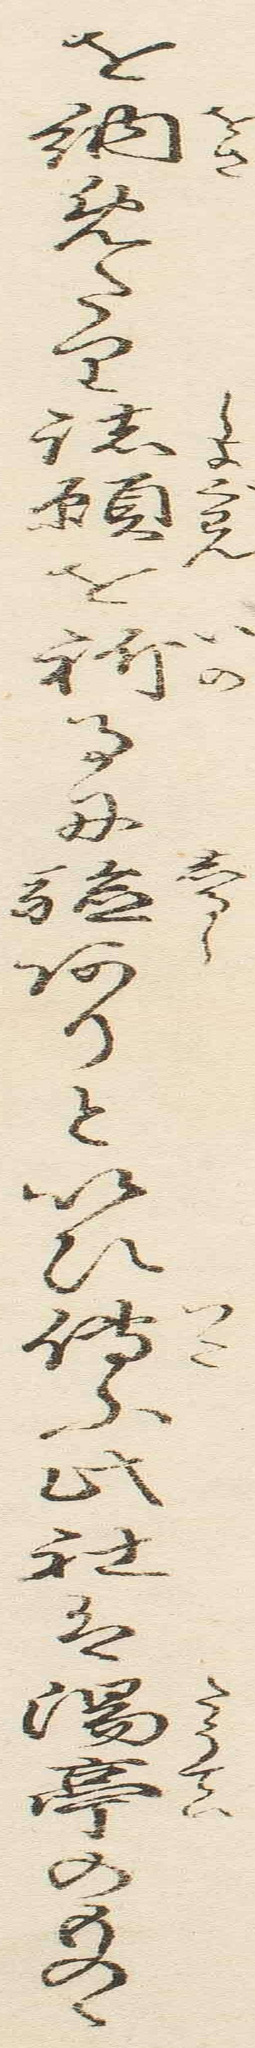を納めたり諸願を祈るに驗ありといひ傳ふ此社は湯亭のものゝ
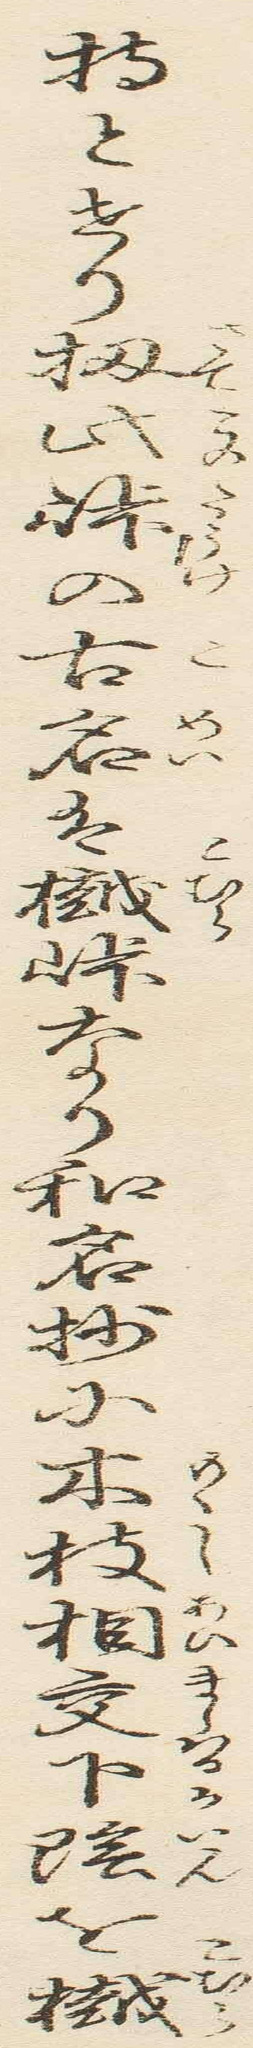持とせり扨此峠の古名は樾峠なり和名抄に木枝相交下陰を樾
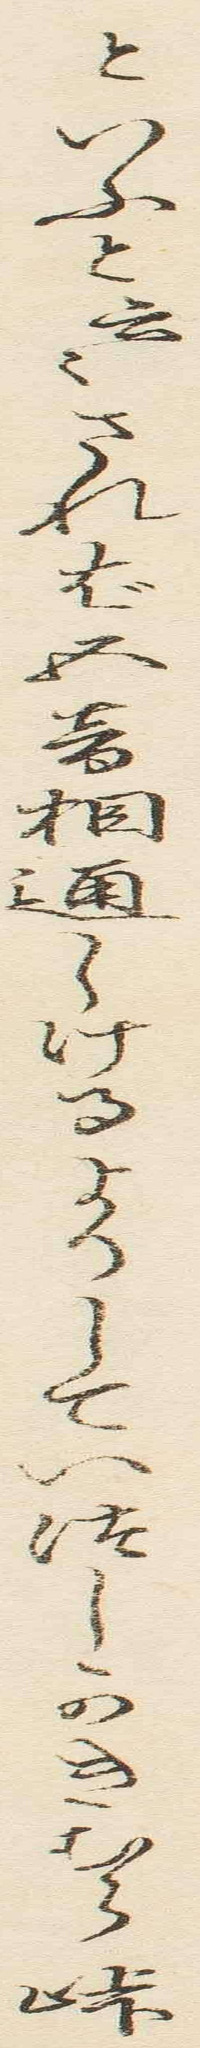といふと云〻されば五音相通しけるよりしていつしかきむら峠
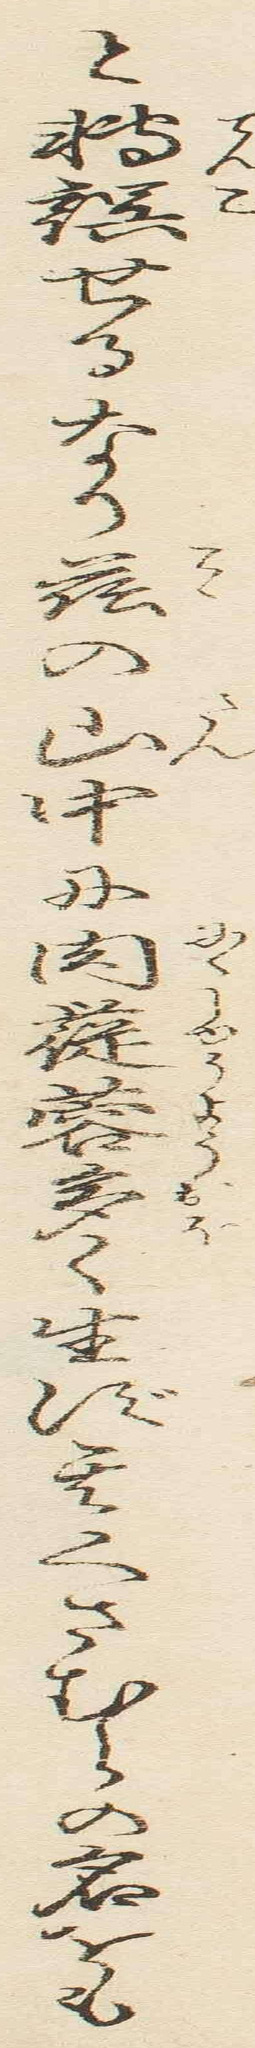と轉誤せるなり兹の山中に肉蓯蓉多く生ず其くさむらの名をも
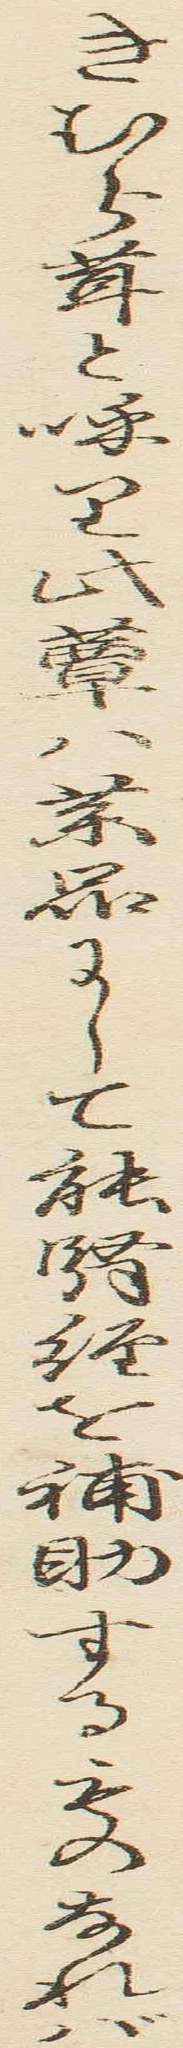きむら茸と呼り此蕈は薬品にして能腎經を補助するものなれば
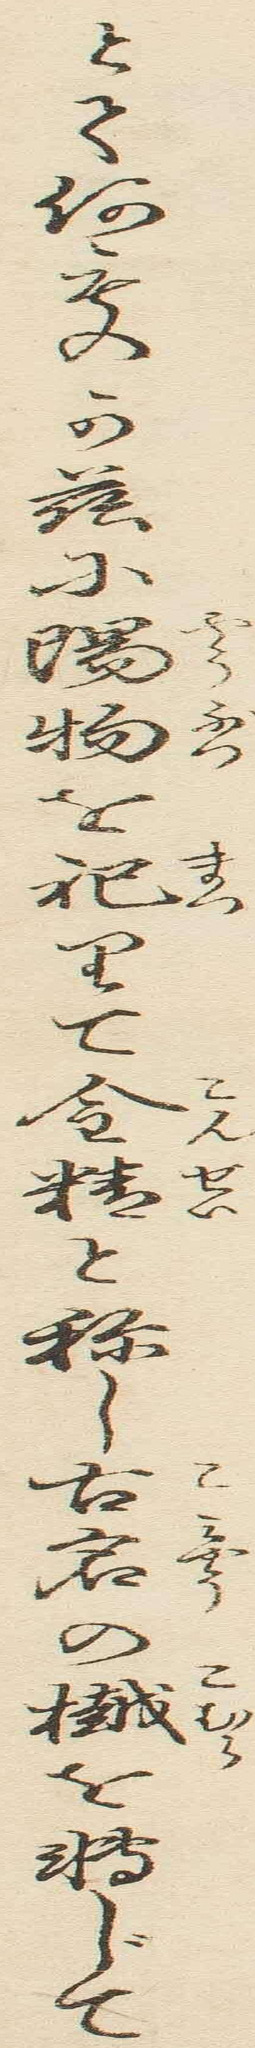とて何ものか兹に陽物を祀りて金精と称し古名の樾を轉じて

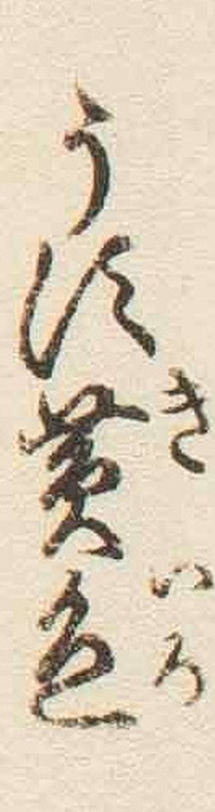うす黄色
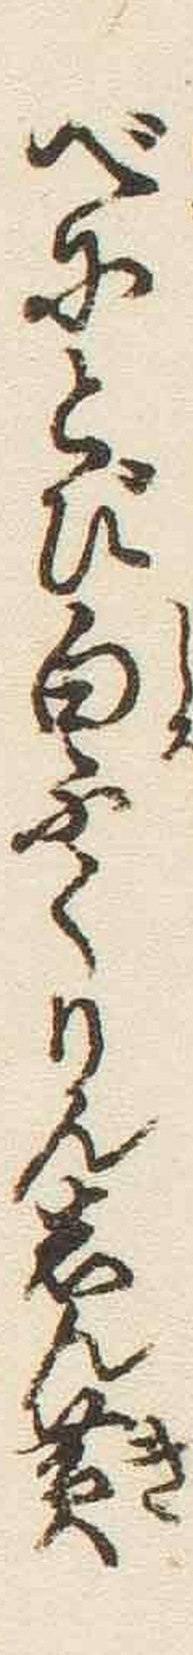べにとび白ふくりんしん黄
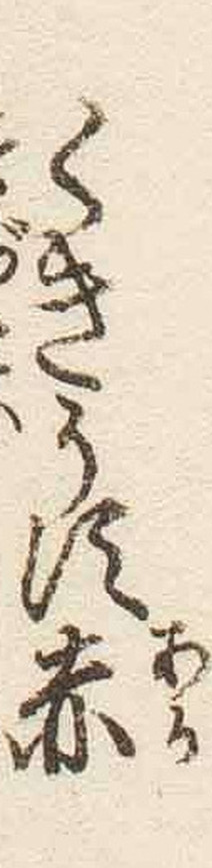くきうす赤
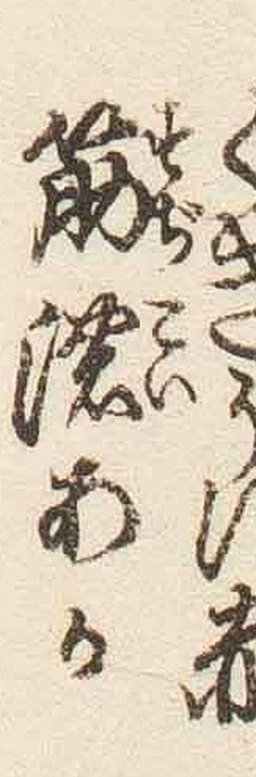筋濃あか
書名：日光山志
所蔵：東京学芸大学附属図書館 国文学研究資料館
